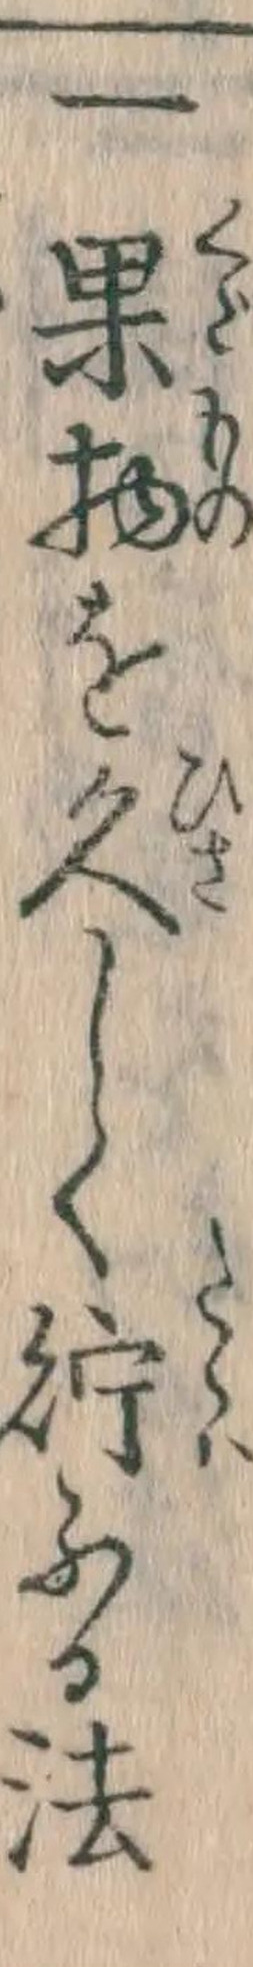一果物を久しく貯ふる法
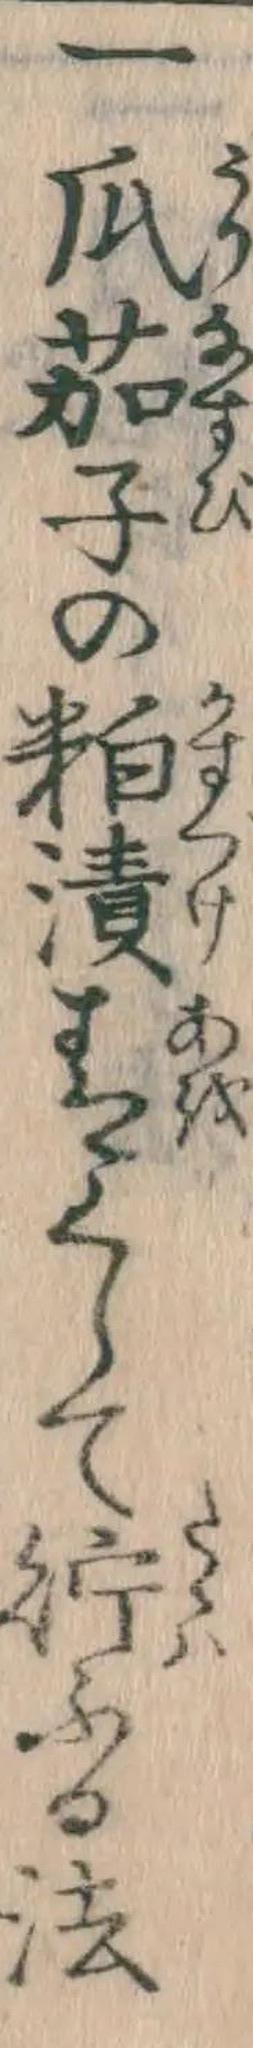一瓜茄子の粕漬青くして貯ふる法
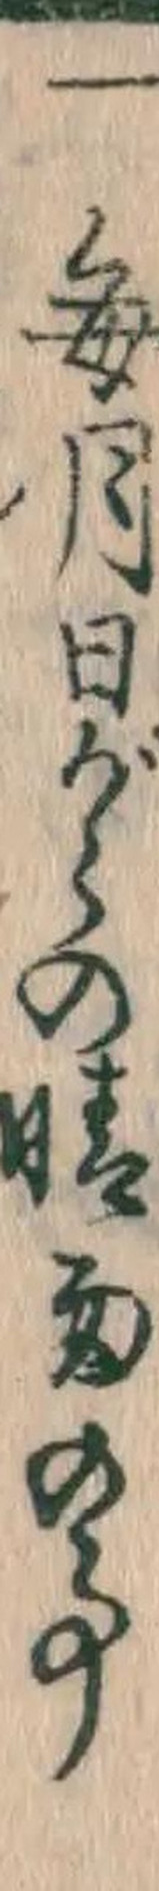一毎月日がらの晴雨の事
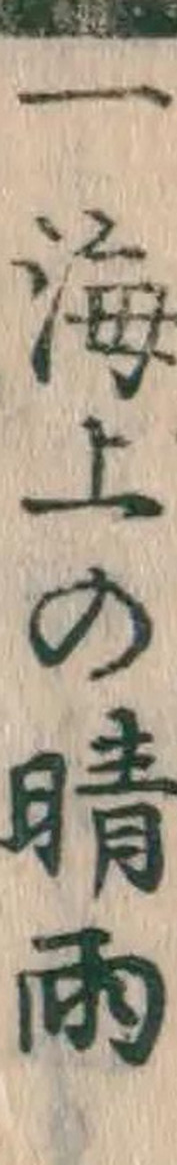一海上の晴雨
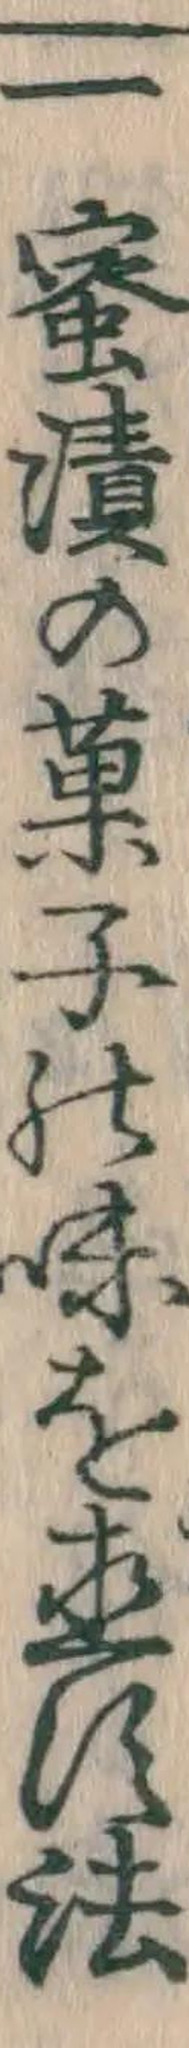一蜜漬の菓子の味を直す法
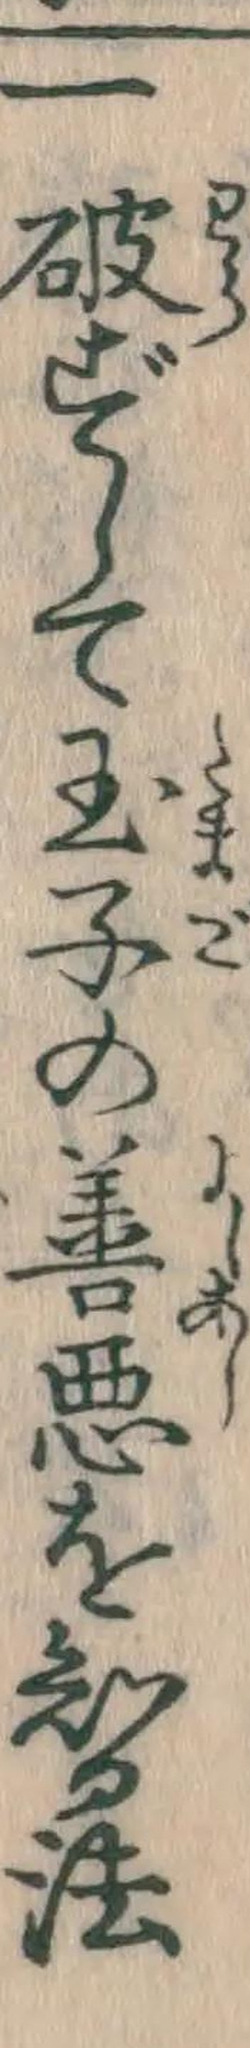一破ずして玉子の善悪を知る法
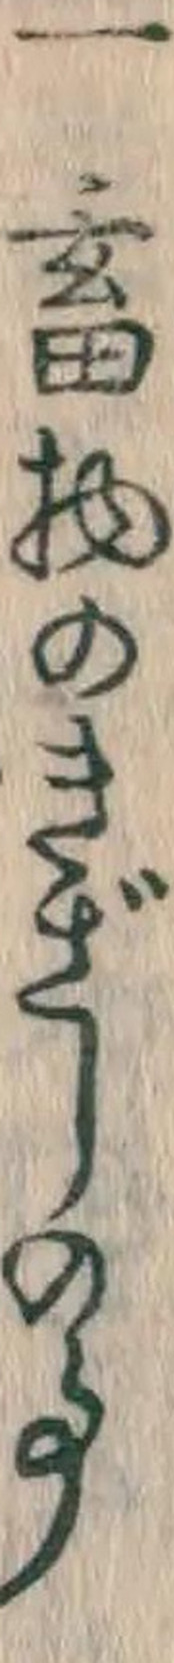一畜物のきざしの事
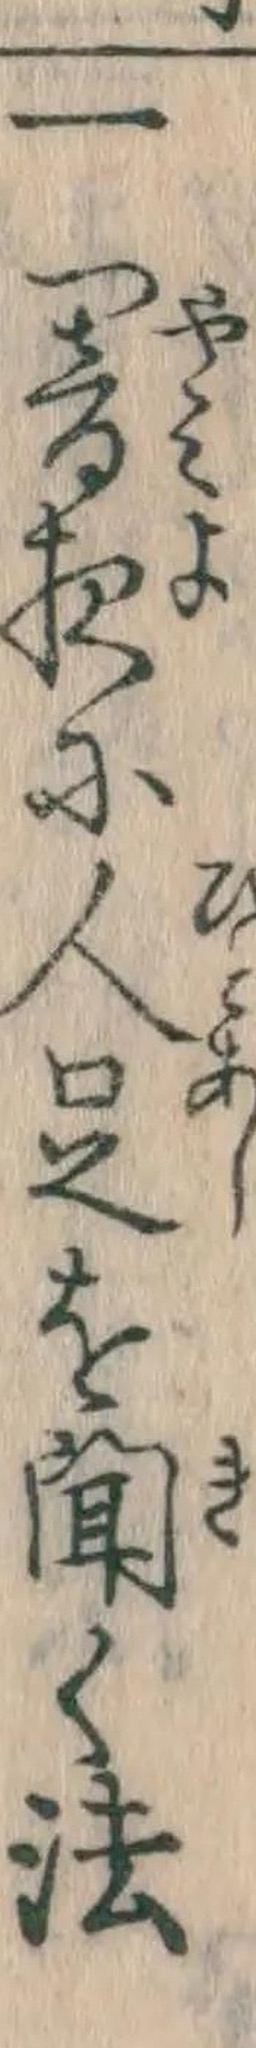一闇夜に人足を聞く法
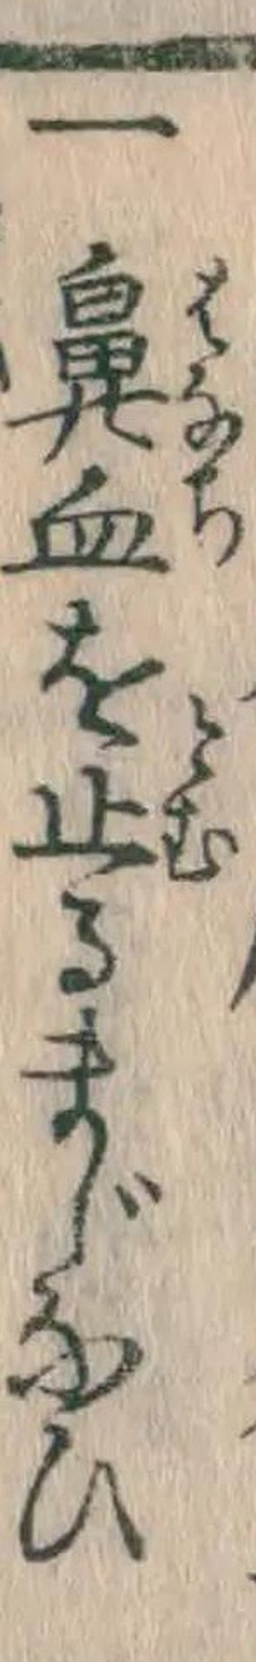一鼻血を止るまじなひ
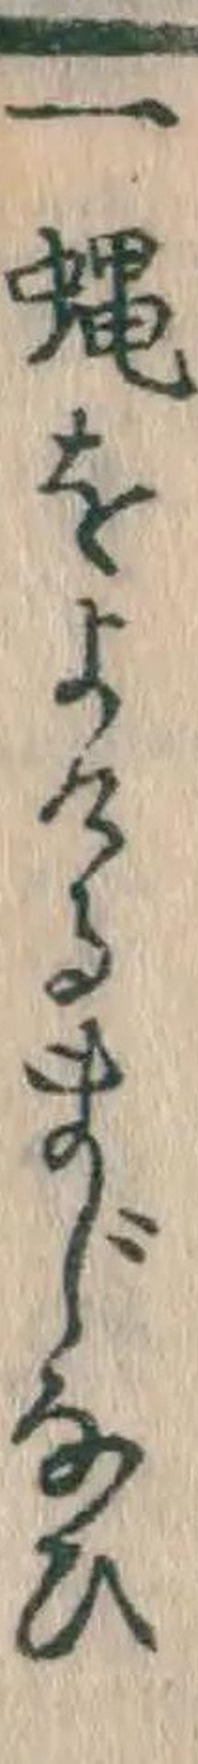一蠅をよけるまじなひ
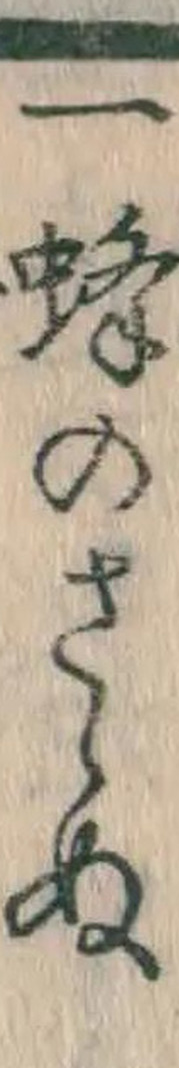一蜂のさらぬ
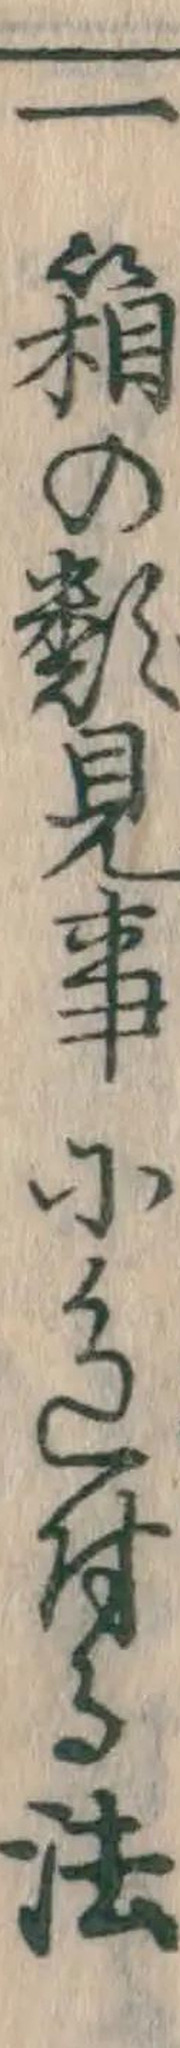一箱の類見事に色付る法
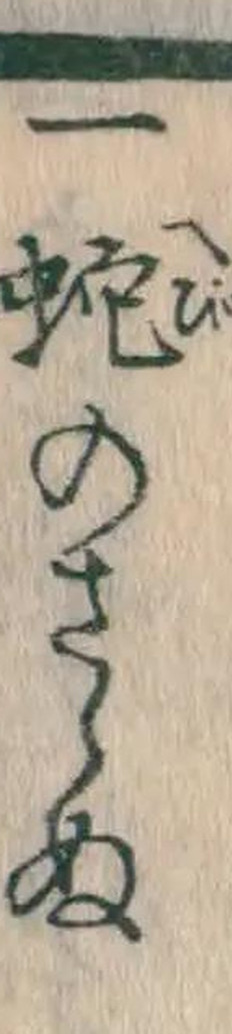一蛇のさらぬ
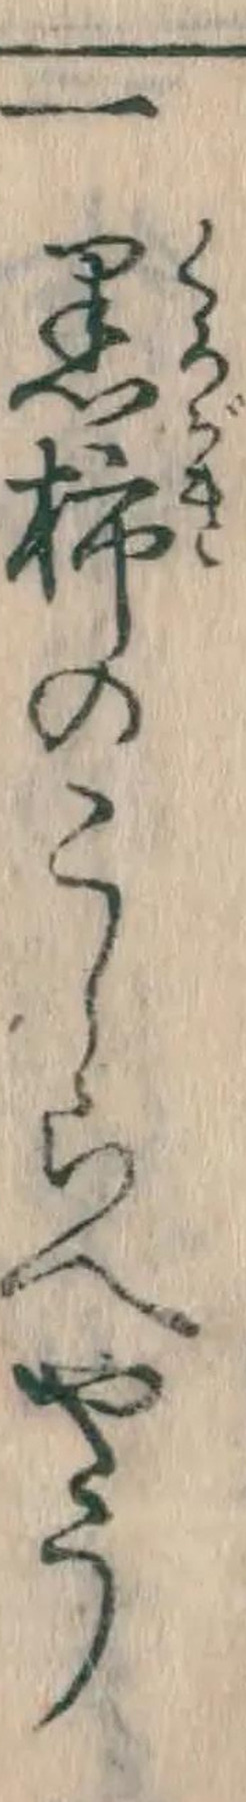一黒柿のこしらへやう
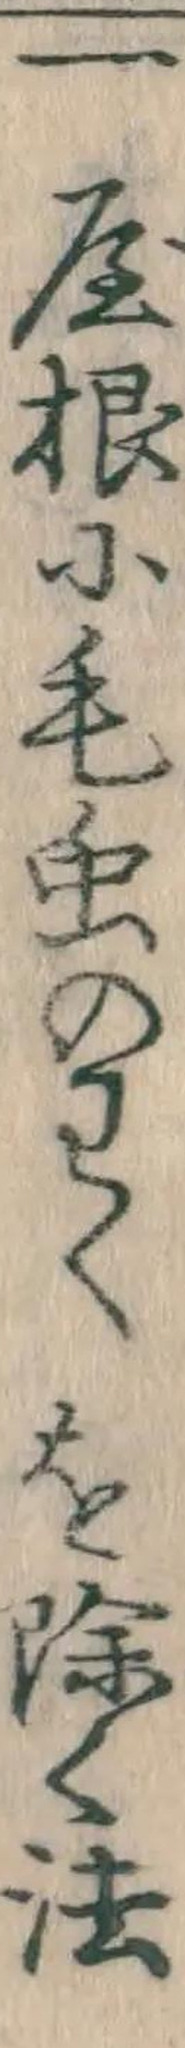一屋根に毛虫のわくを除く法
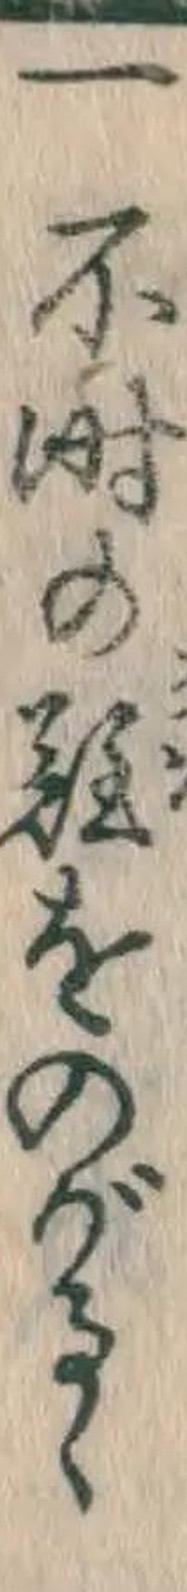一不時の難をのがるゝ
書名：広益秘事大全 3巻. [1]
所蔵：国立国会図書館 National Diet Library, JAPAN
